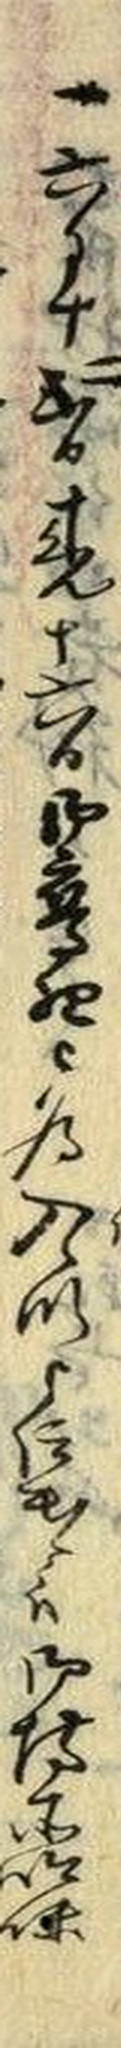一六月十二日来ル十六日御鷹野被為入候段被仰出候ニ付御場所吟味
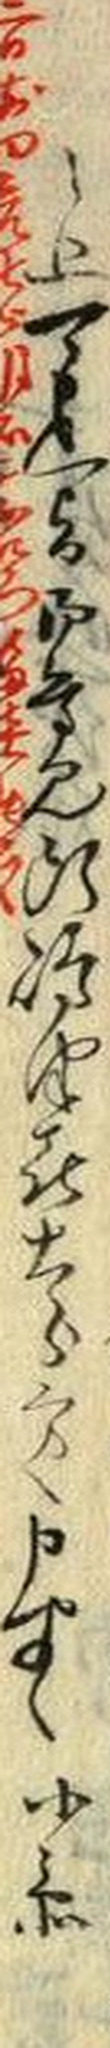之上可被申上旨御鳥見頭嶋津喜太郎方へ申聞候小兵衛
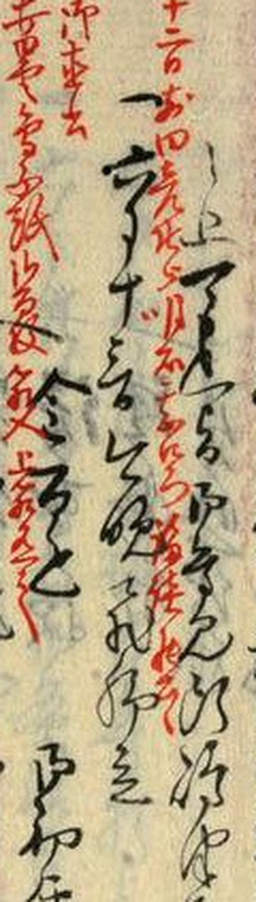一六月十三日今晩飛脚立
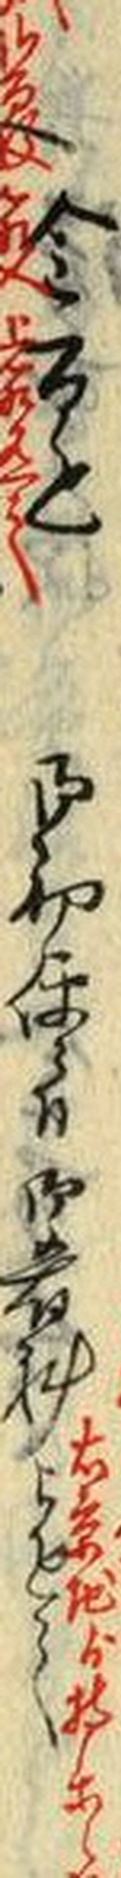金百疋御初便ニ付御肴料被進之
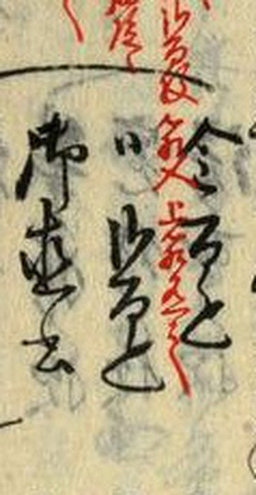同弐百疋
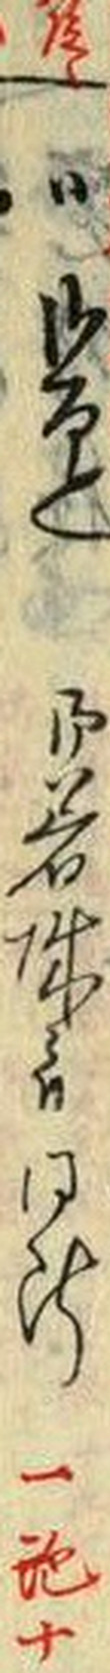同弐百疋御着城ニ付同断
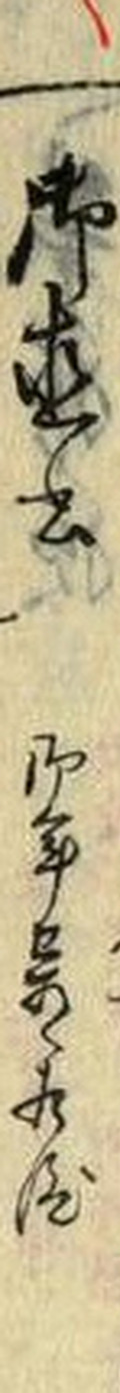御直書御年寄へ相渡
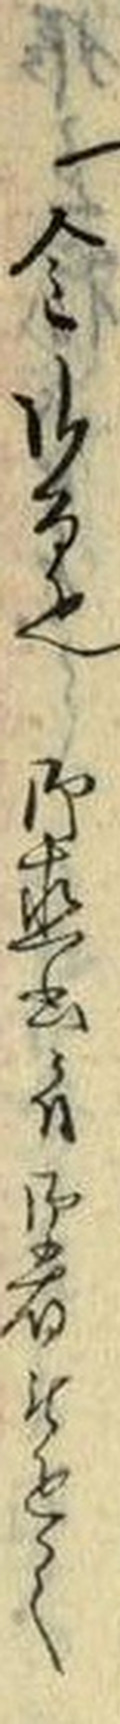金弐百疋御直書ニ付御肴被進之
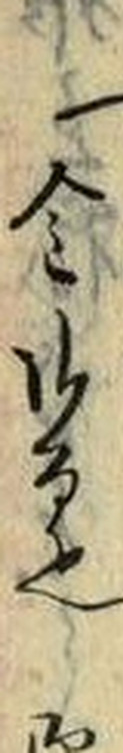同弐百疋

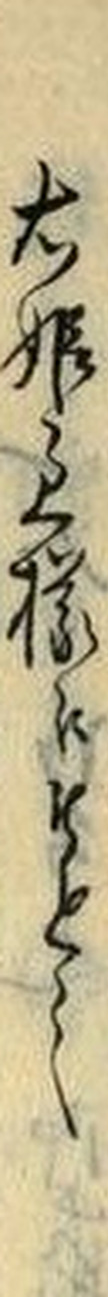右姫君様へ被進之
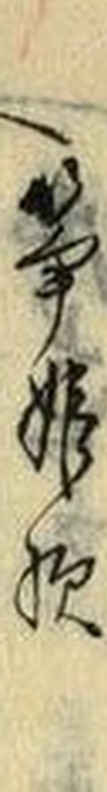箏姫様
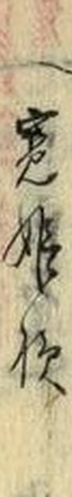寛姫様
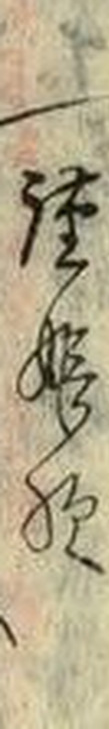謹姫様
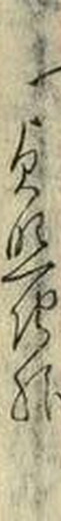貞照院様
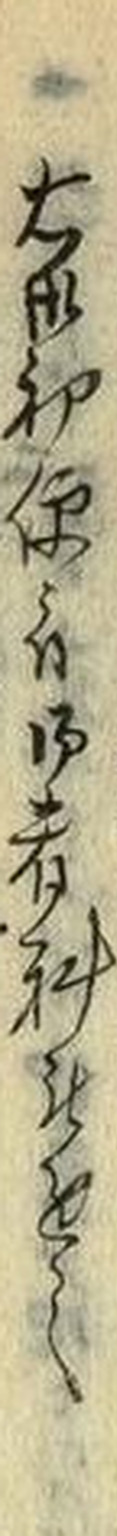右御初便ニ付御肴料被進之
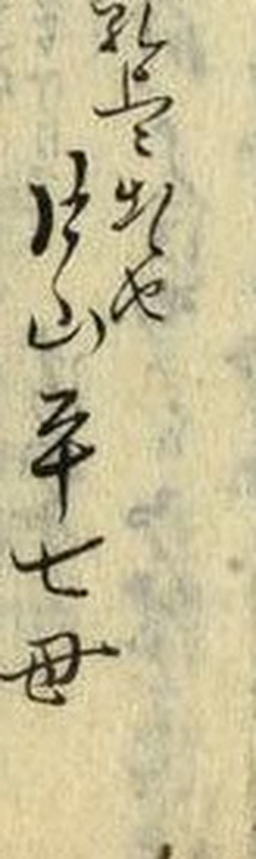片山平七母
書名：少傅日録抄（斉承付側向頭取日記、在国）
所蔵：福井県文書館 Fukui Prefectural Archives
